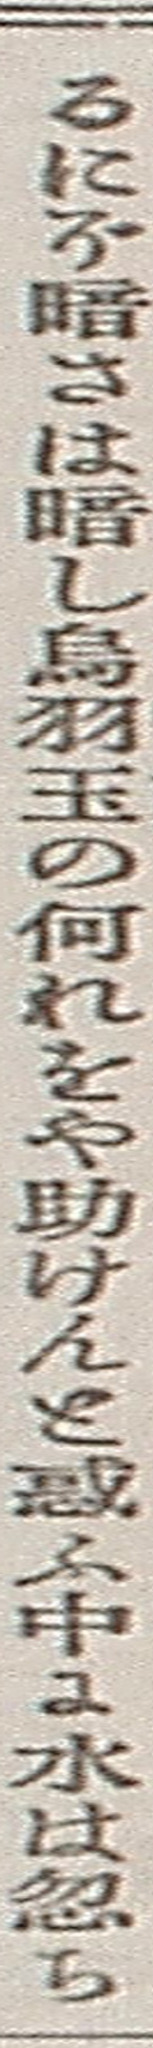るにぞ暗さは暗し烏羽玉の何れをや助けんと惑ふ中に水は忽ち
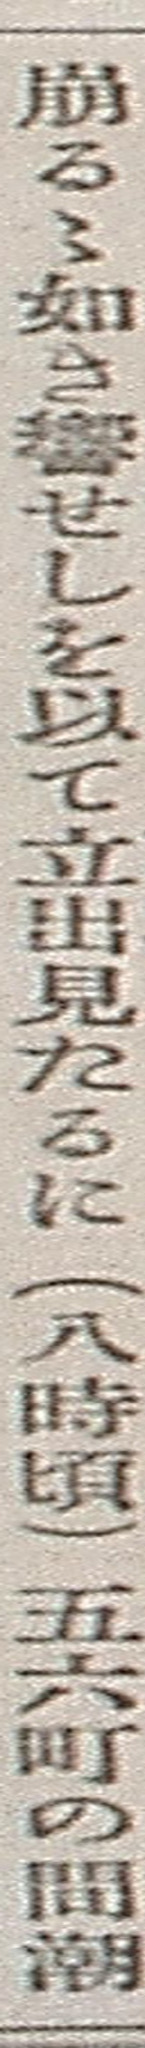崩る〻如き響せしを以て立出見たるに五六町の間潮

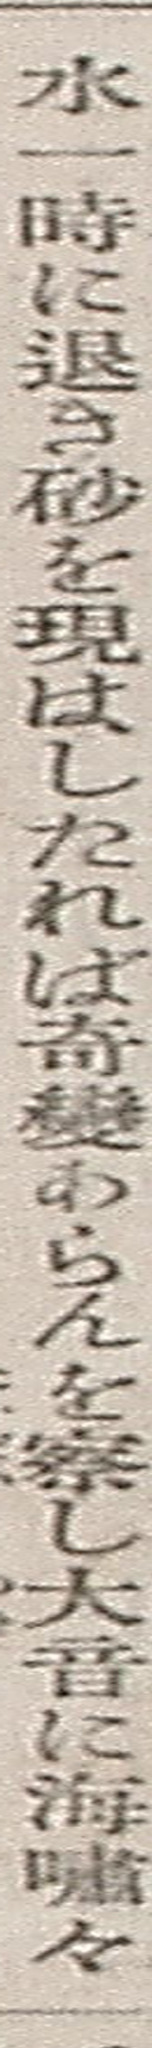水一時に退き砂を現はしたれば奇変あらんを察して大音に海嘯々
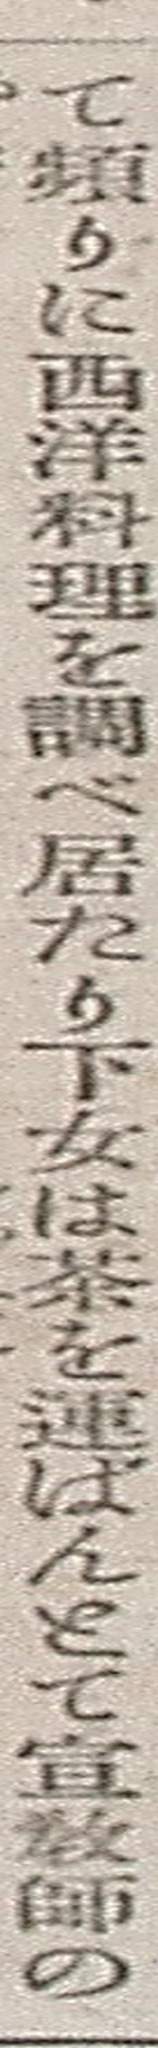て頻りに西洋料理を調べ居たり下女は茶を運ばんとて宣教師の
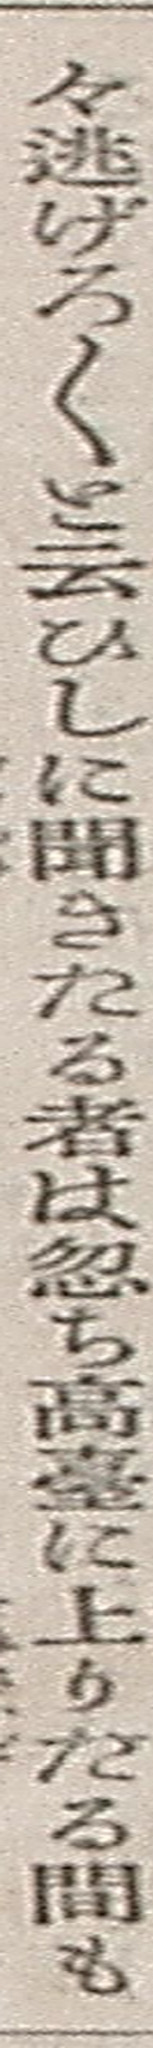々逃げろ〳〵と云ひしに聞きたる者は忽ち高台に上りたる間も
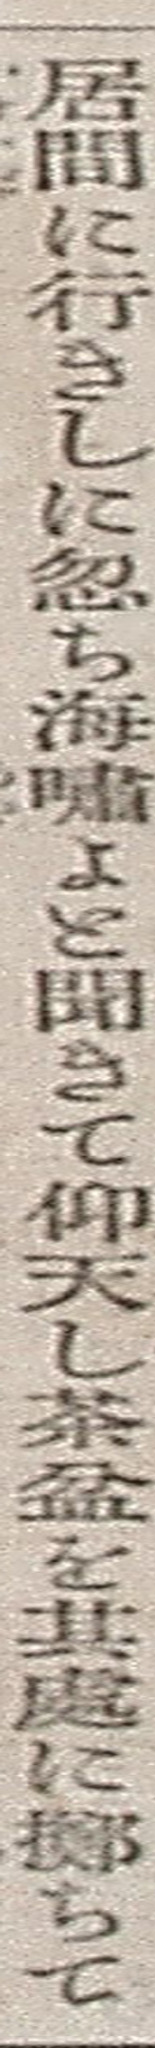居間に行きしに忽ち海嘯よと聞きて仰天し茶盆を其処に擲ちて
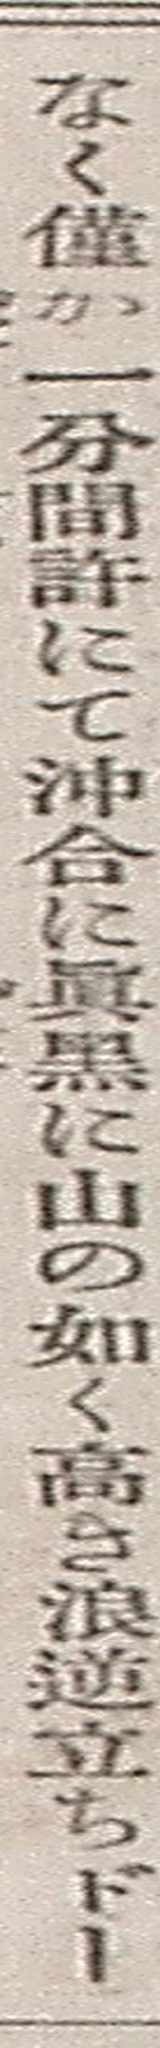なく僅か一分間許にて沖合に真黒に山の如く高き浪逆立ちドー
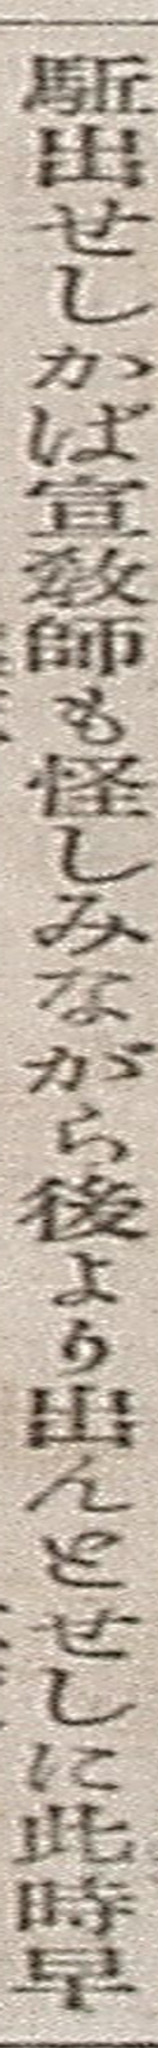駈出せしかば宣教師も怪しみながら後より出んとせしに此時早
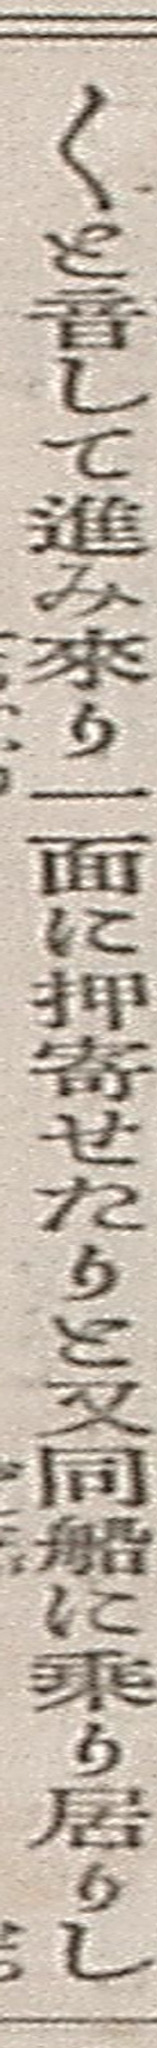と音して進み来り一面に押寄せたりと又同船に乗り居りし
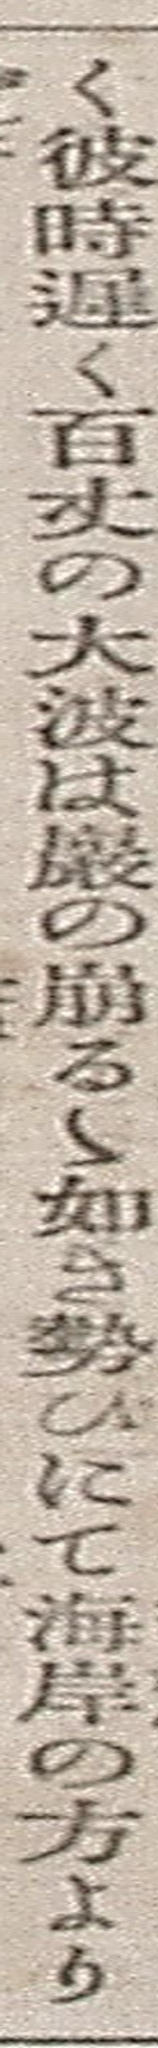く彼時遅く百丈の大波は巖の崩るゝ如き勢ひにて海岸の方より
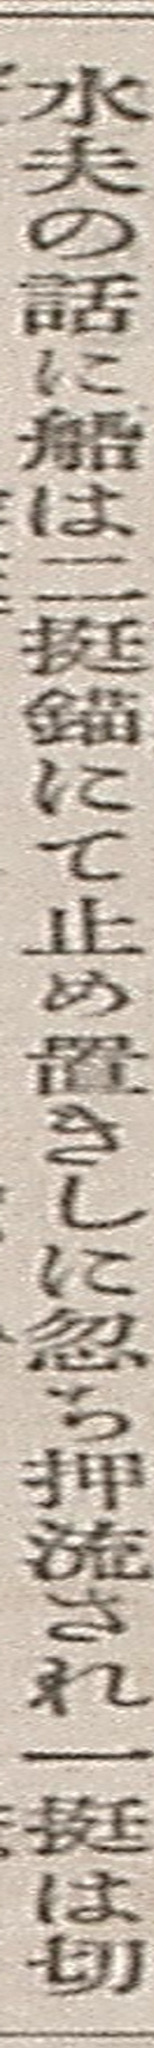水夫の話に船は二挺錨にて止め置きしに忽ち押流され一挺は切
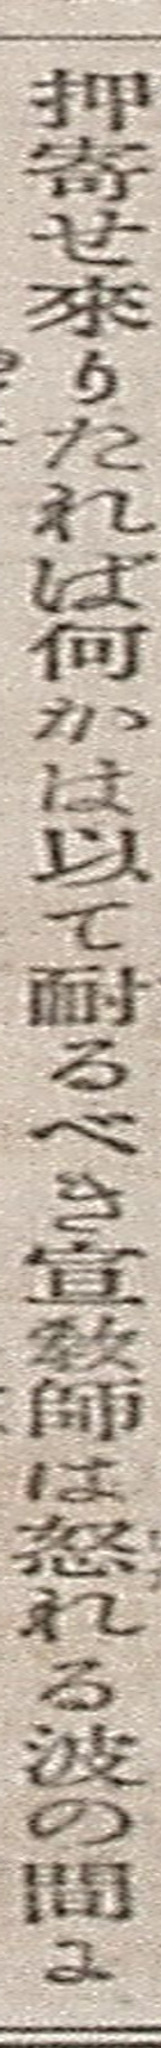押寄せ来りたれば何かは以て耐るべき宣教師は怒れる波の間に
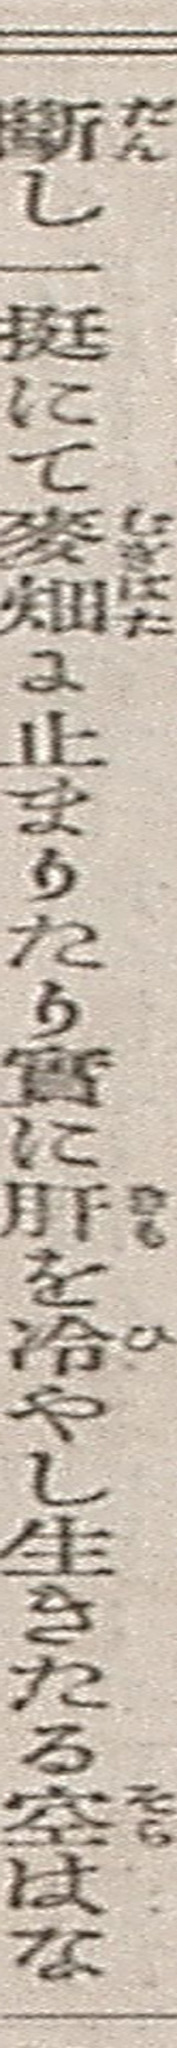断し一挺にて麦畑に止まりたり実に肝を冷やし生きたる空はな
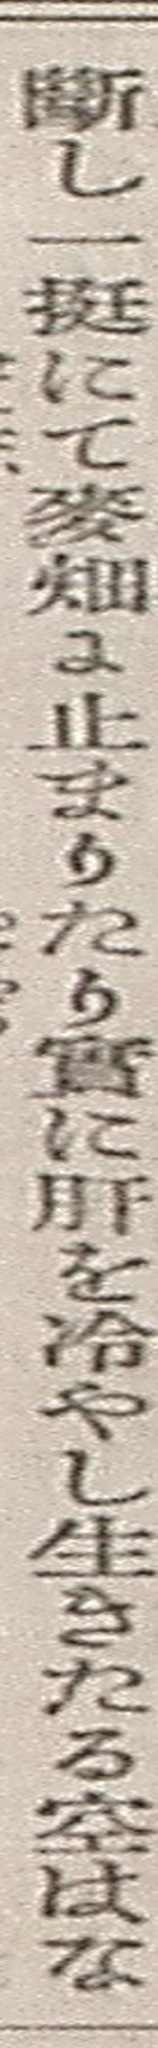断し一挺にて麦畑に止まりたり実に肝を冷やし生きたる空はな
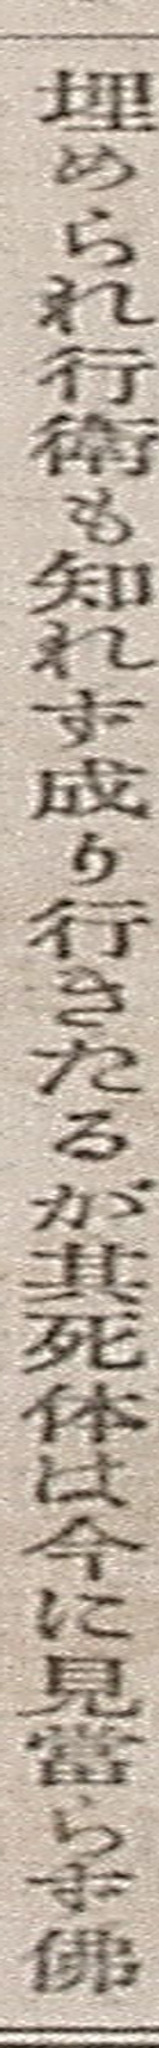埋められ行衛も知れず成り行きたるが其死体は今に見当らず仏
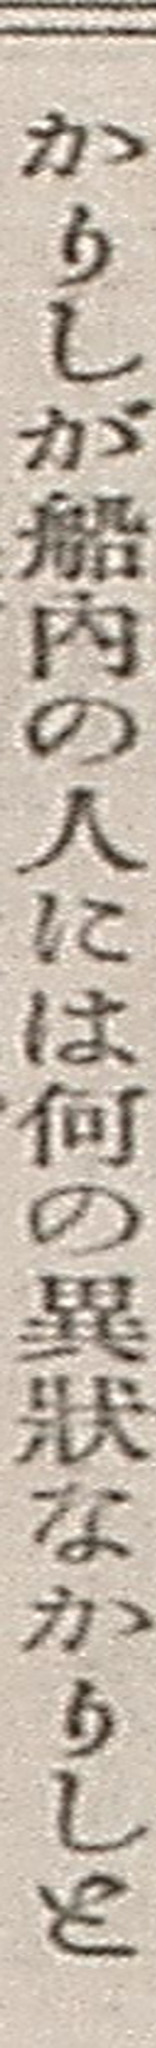かりしが船内の人には何の異状なかりしと
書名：風俗畫報臨時増刊第百十九號　大海嘯被害録（中）
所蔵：東京大学地震研究所図書室 Earthquake Research Institute Library, The University of Tokyo, JAPAN
